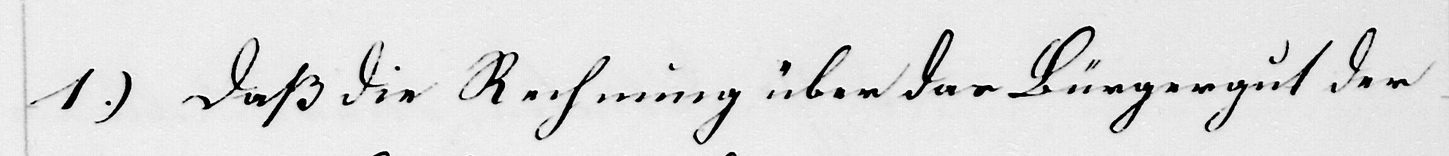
1.) Daß die Rechnung über das Bürgergut der
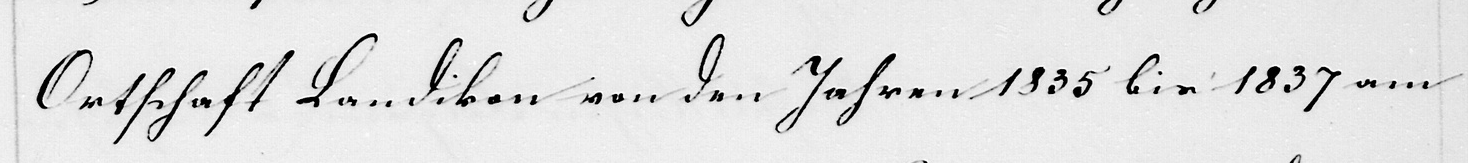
Ortschaft Landikon von den Jahren 1835 bis 1837 am
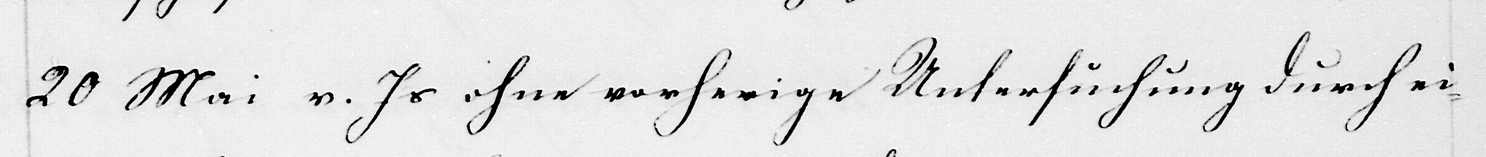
20 Mai v. Js ohne vorherige Untersuchung durch ei¬
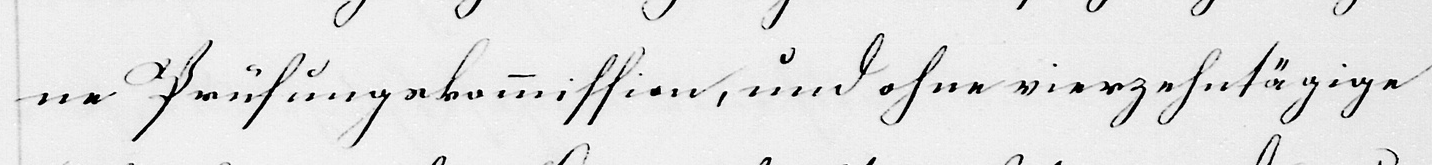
ne Prüfungskommission, und ohne vierzehntägige
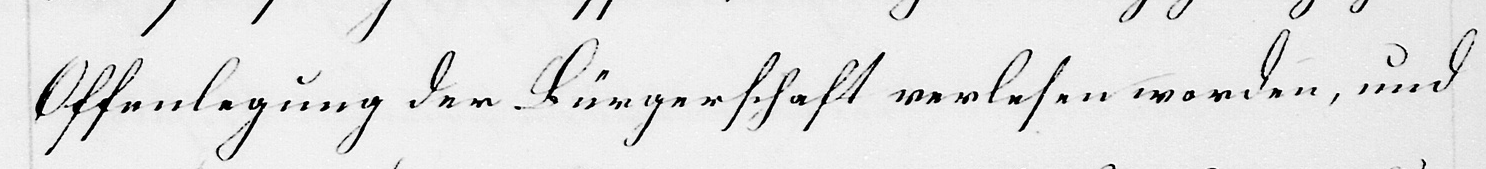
Offenlegung der Bürgerschaft verlesen worden, und
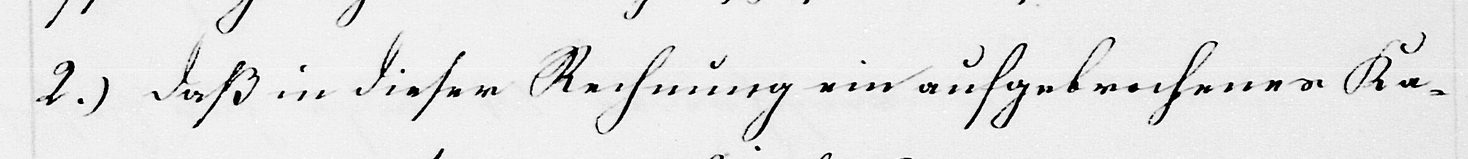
2.) Daß in dieser Rechnung ein aufgebrochenes Ka¬
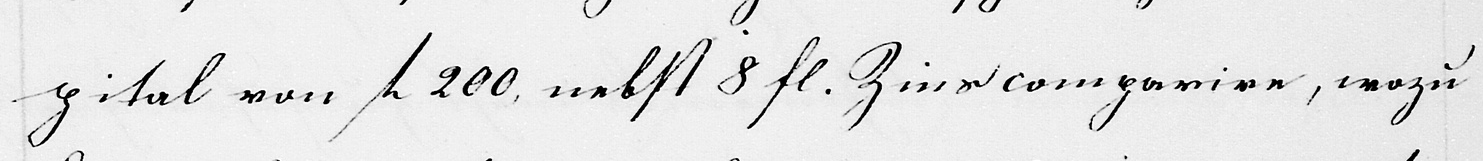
pital von fl 200. nebst 8 fl. Zins comparire, wozu
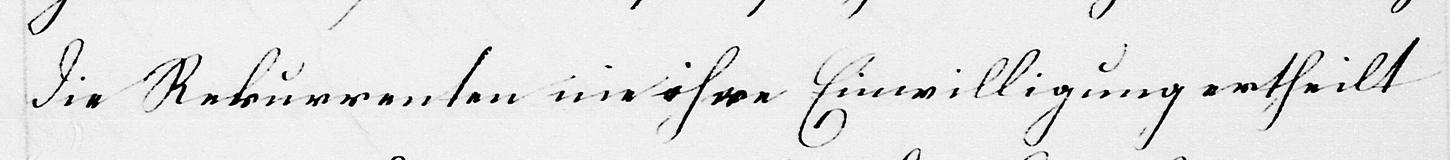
die Rekurrenten nie ihre Einwilligung ertheilt
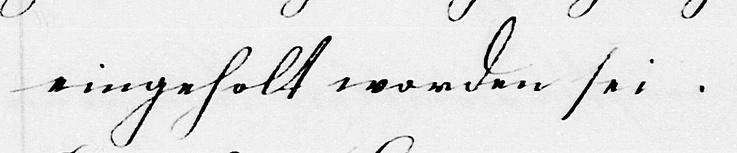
eingeholt worden sei.
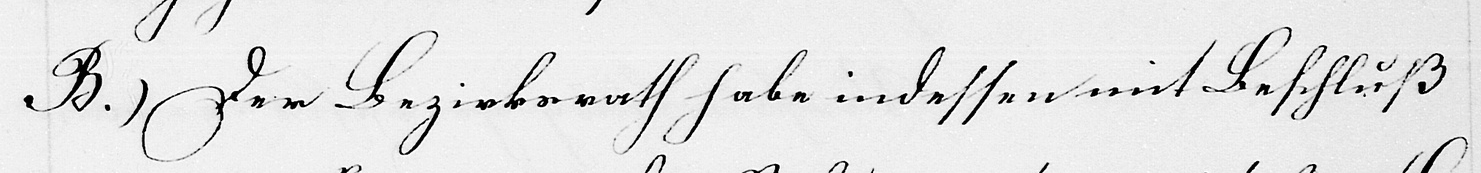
B.) Der Bezirksrath habe indessen mit Beschluß
